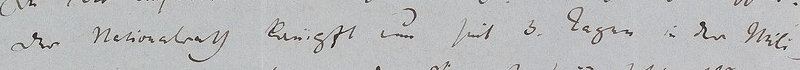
Der Nationalrath kämpft nun seit 3. Tagen in der Mili-
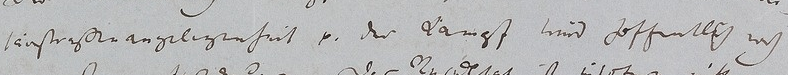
tärstrassenangelegenheit &. der Kampf wird hoffentlich noch
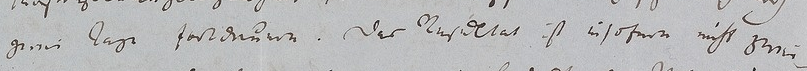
zwei Tage fortdauern. Das Resultat ist insofern nicht zwei-
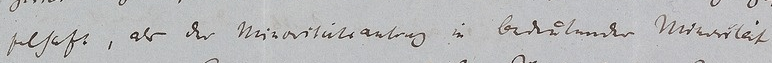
felhaft, als der Minoritätsantrag in bedeutender Minorität
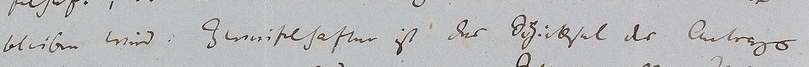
bleiben wird. Zweifelhafter ist das Schicksal des Antrags
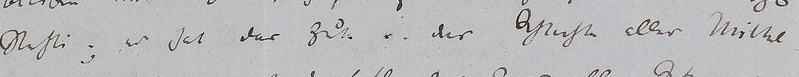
Stehli; er hat das Gute &. das Schlechte aller Mittel-
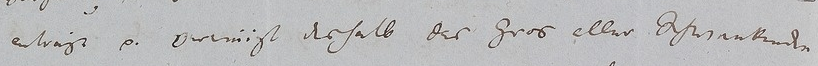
anträge &. vereinigt deshalb das Gros aller Schwankenden.
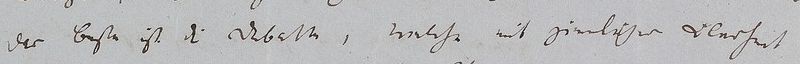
Das Beste ist die Debatte, welche mit ziemlicher Klarheit
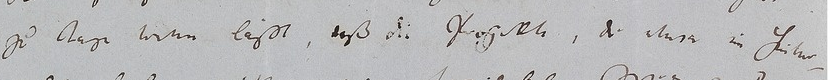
zu Tage treten läßt, daß die Projekte, die etwa im Hinter-
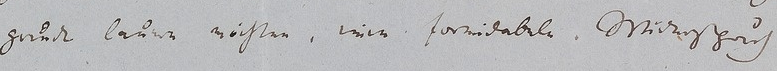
grunde lauern möchten, einen formidabeln Widerspruch
